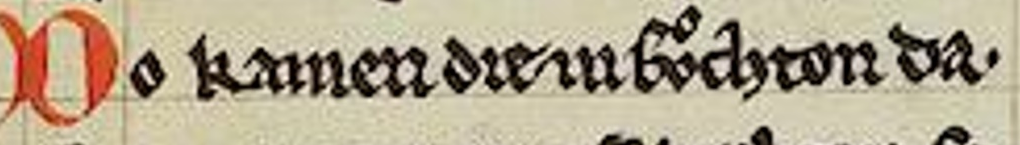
*Do kamen die in ſv°ochton da.
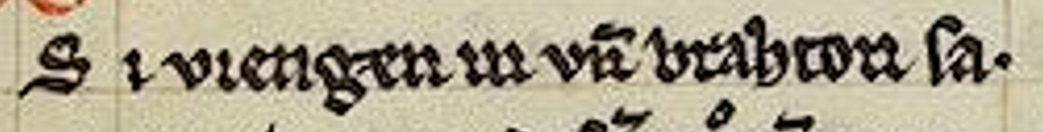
Si viengen in vn(d) brahton ſa.
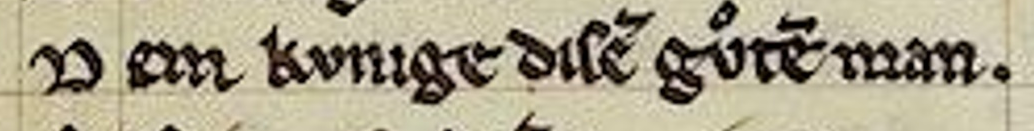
Dem kvnige diſe(n) gv°ote(n) man.
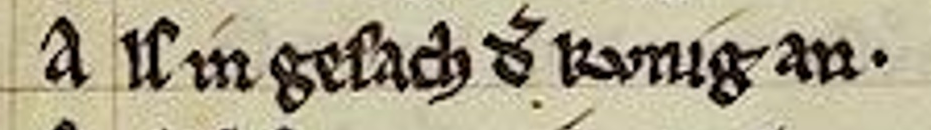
Alſ in geſach d(er) kvnig an.
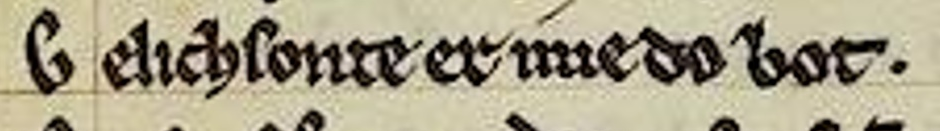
Gelichſonte er ime do bot.
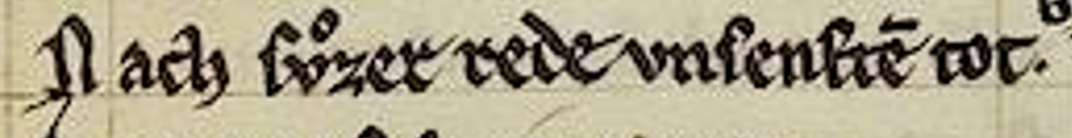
Nach ſv°ozer rede vnſenfte(n) tot.
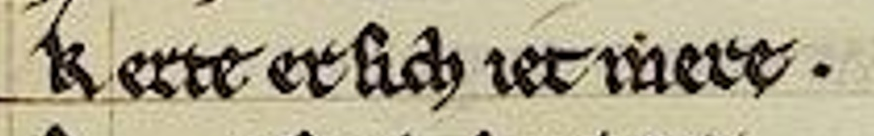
Kerte er ſich iet mere.
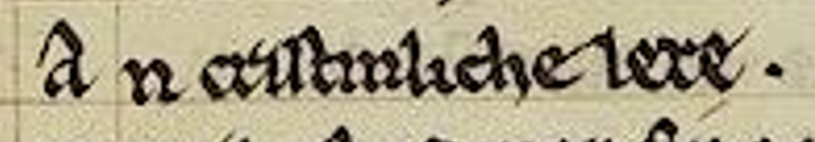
An criſtinliche lere.
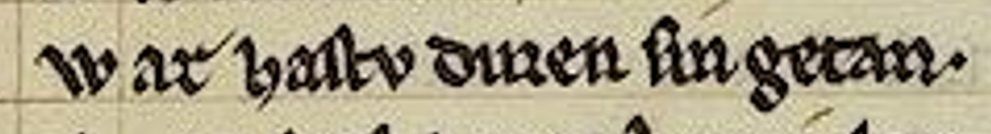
War haſtv dinen ſin getan.
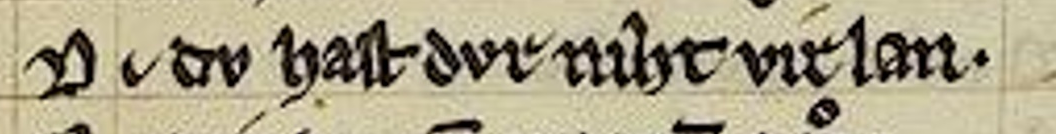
D(az) dv haſt dvr niht virlan.
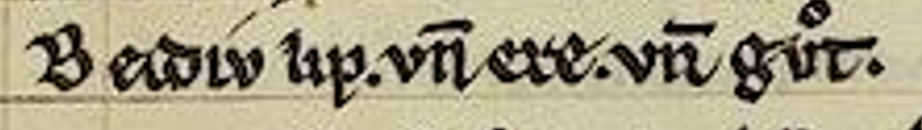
Beidiv lip. vn(d) ere. vn(d) gv°ot.
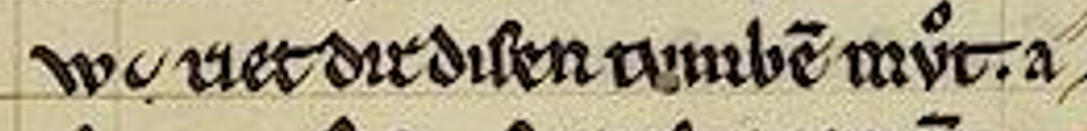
W(az) riet dir diſen tvmbe(n) mv°ot.
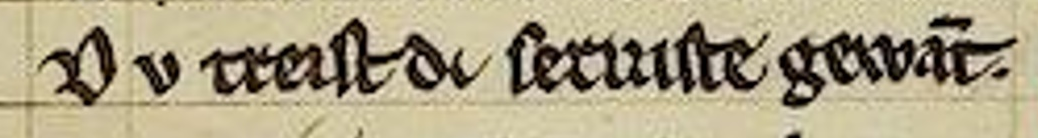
Dv treiſt d(az) feruiſte gewa(n)t.
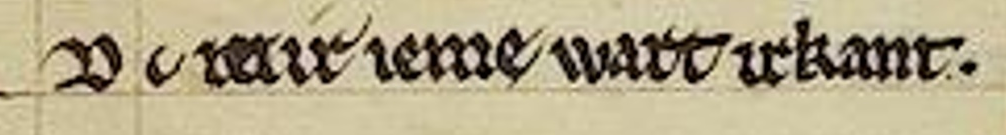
D(az) mir ieme wart irkant.
